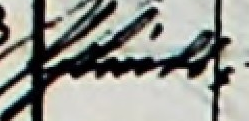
Pflinds„
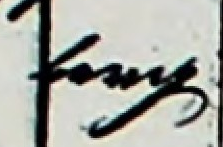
berg
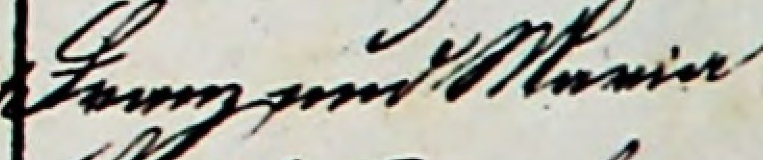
Franz und Maria
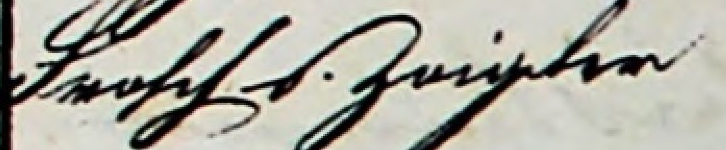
Frosch v. Zoigler
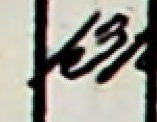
131
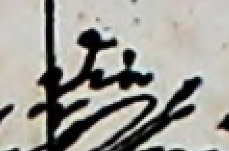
die
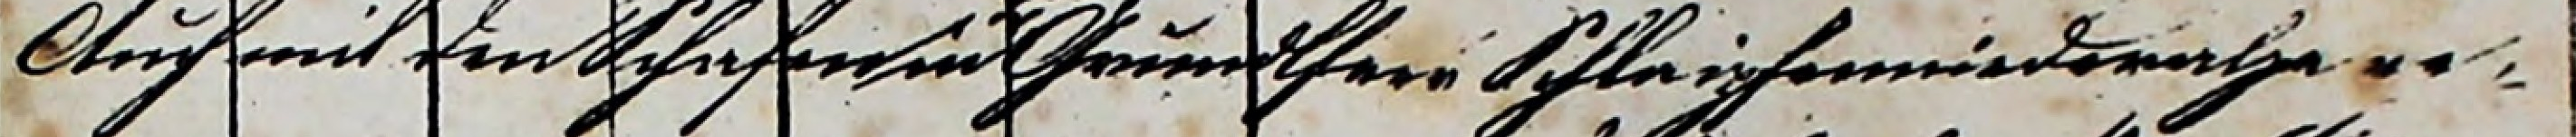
Auch den Schafen in Grundlheer Schlaipfenniederalza ???
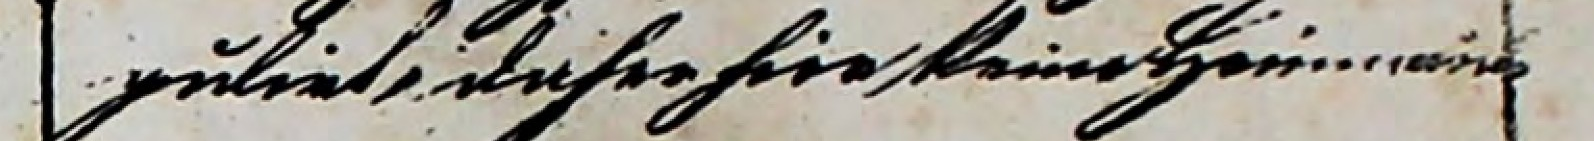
gulirt, daher hier keine Hei???
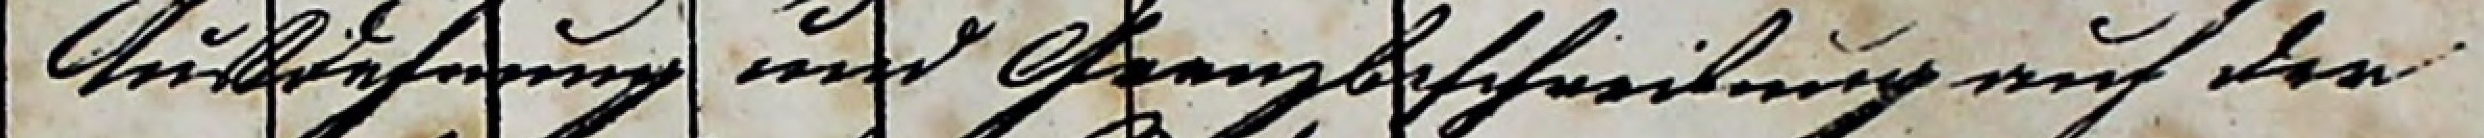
Ausdehnung und Grenzbeschreibung auf der
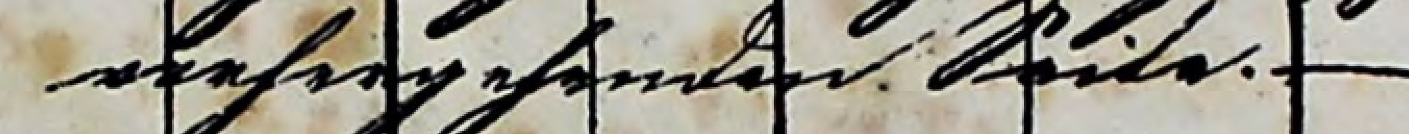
vorhergehenden Seite.—
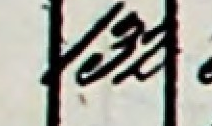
132
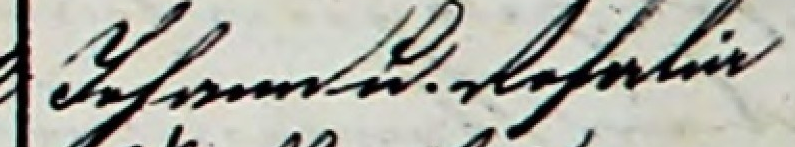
Johann u. Rosalia
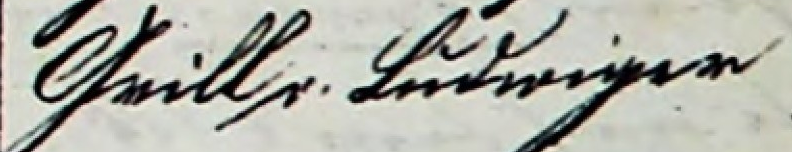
Grill v. Ludwiger
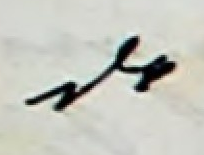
do
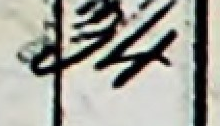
34
